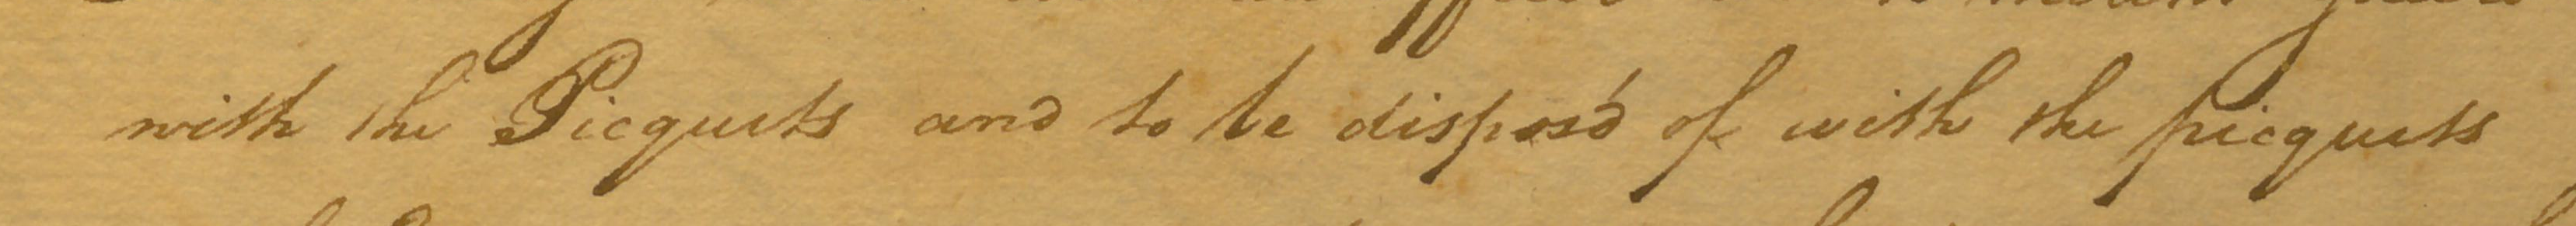with the Piquets and to be dispos'd of with the picquets
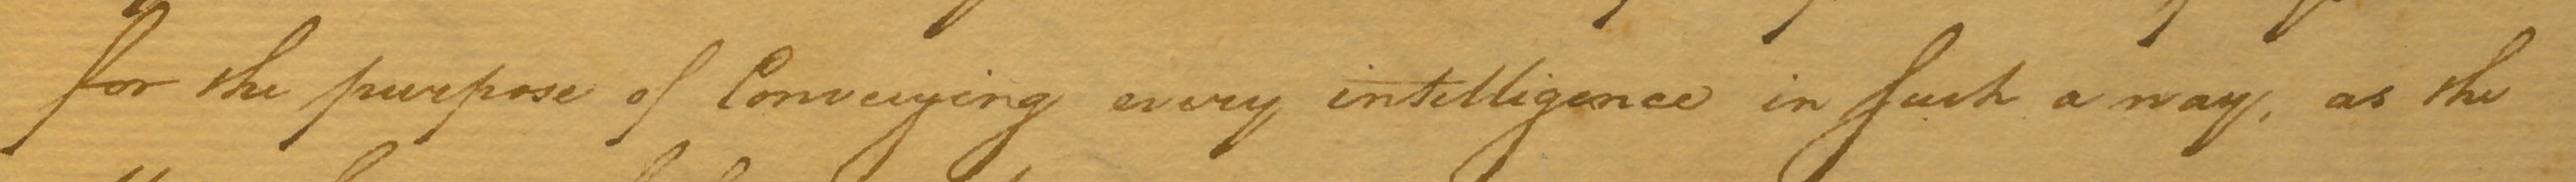for the purpose of Conveying every intelligence in Such a way, as the
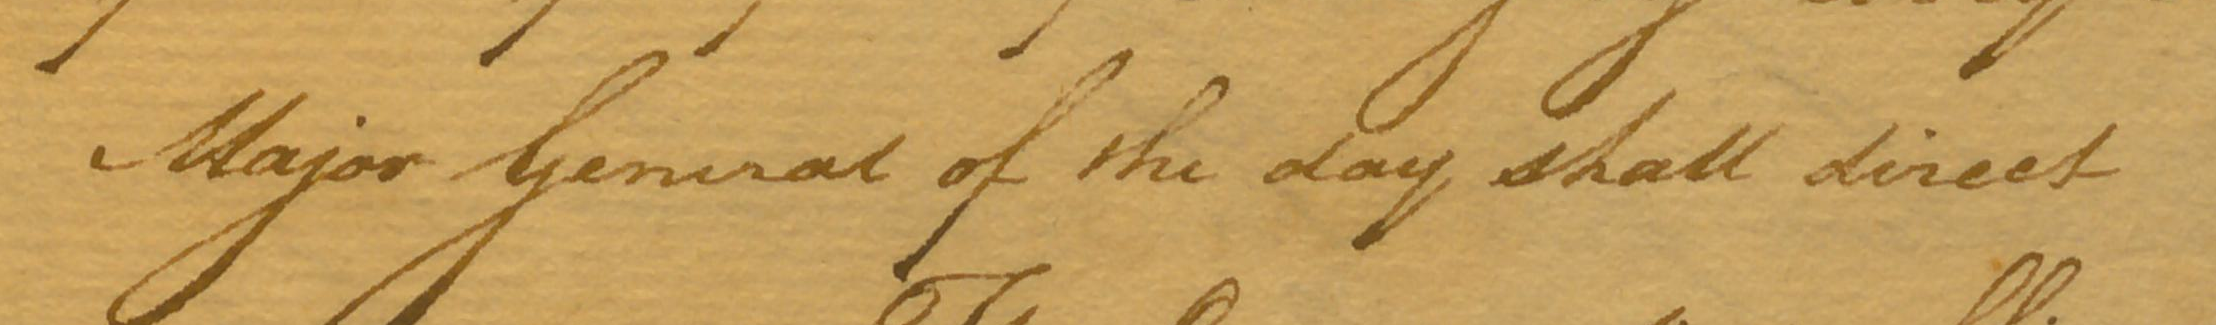Major General of the day shall direct
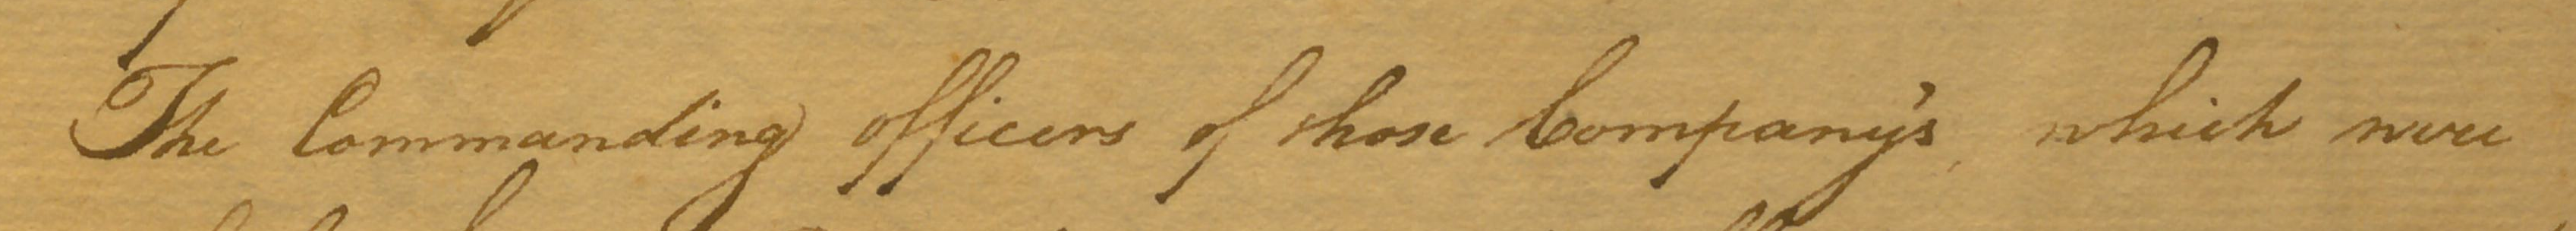The Commanding officers of those Company's which were
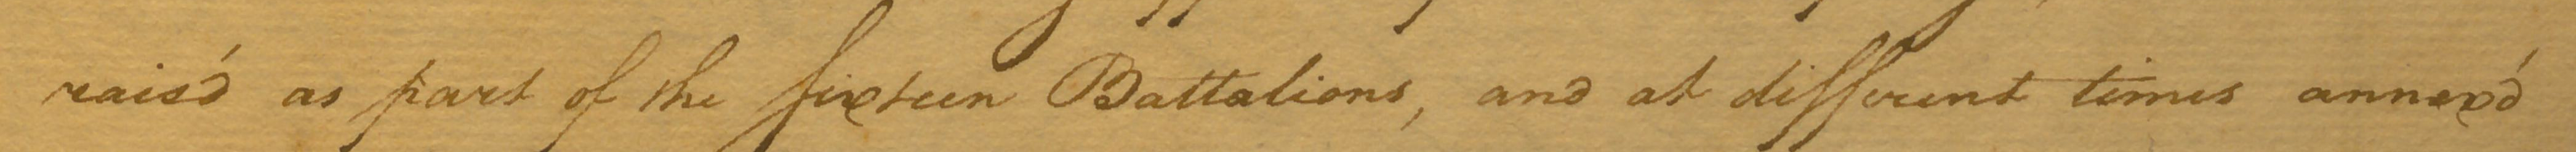rais'd as part of the sixteen Battalions, and at different times annex'd
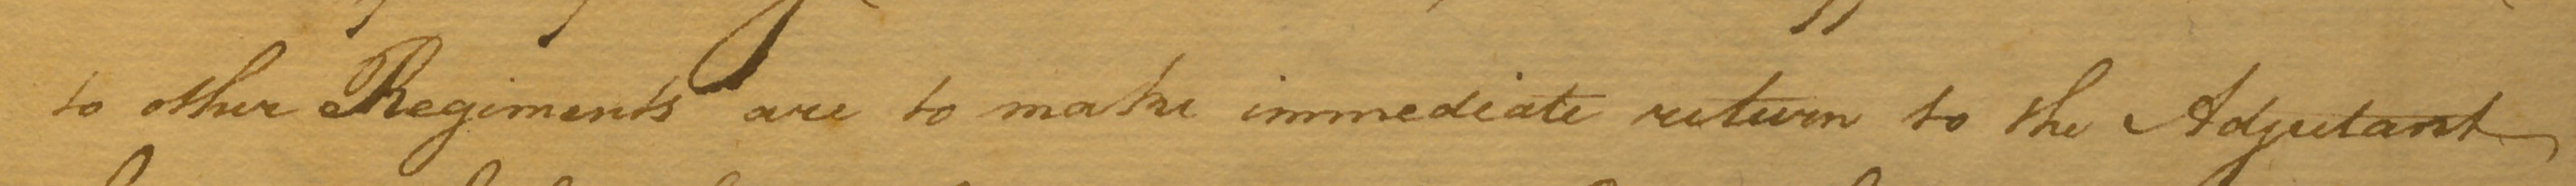to other Regiments are to make immediate return to the Adjutant
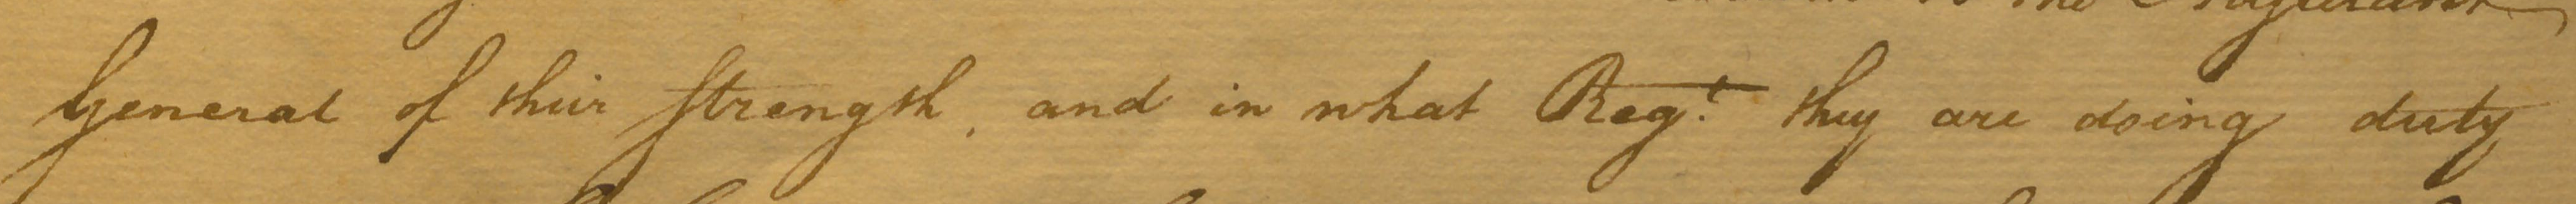General of their Strength, and in what Reg^t. they are doing duty
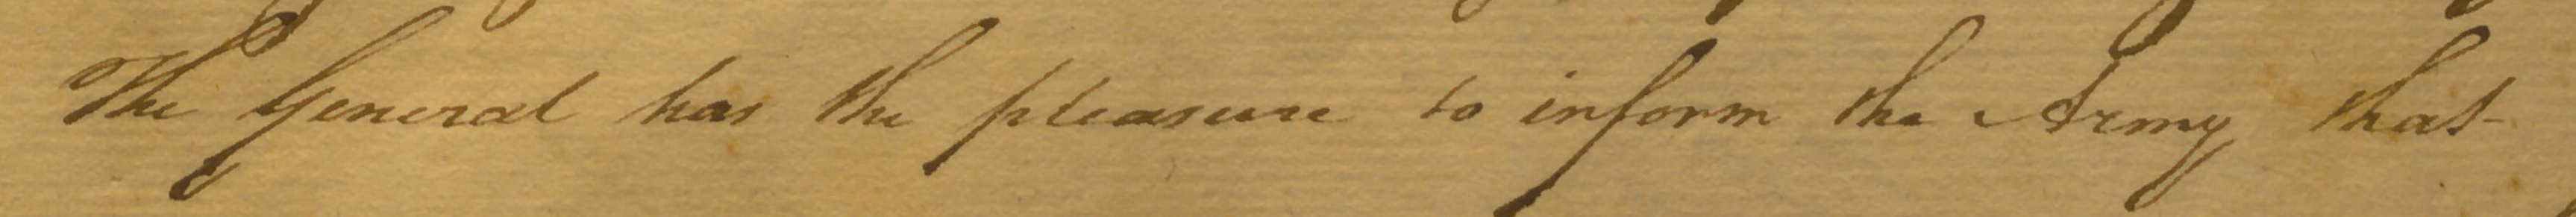The General has the pleasure to inform the Army that
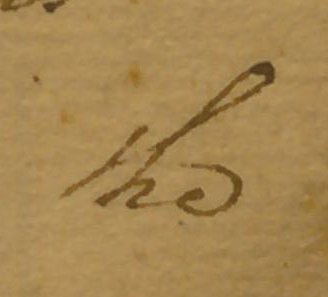the
